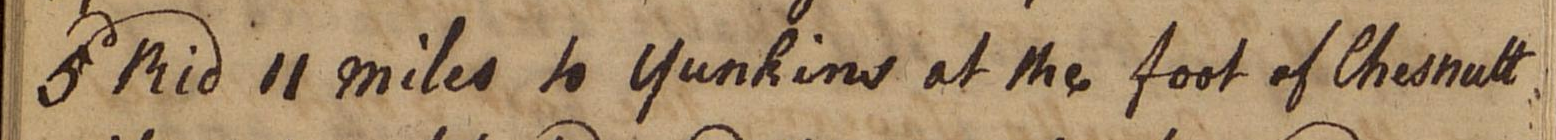5^d Rid 11 miles to Yunkins at the foot of Chesnutt
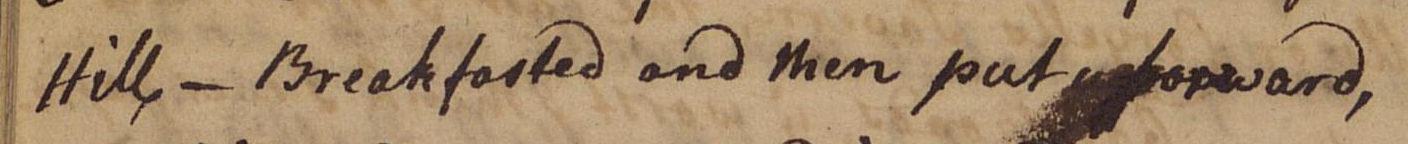Hill- Breakfasted and then put utopward,
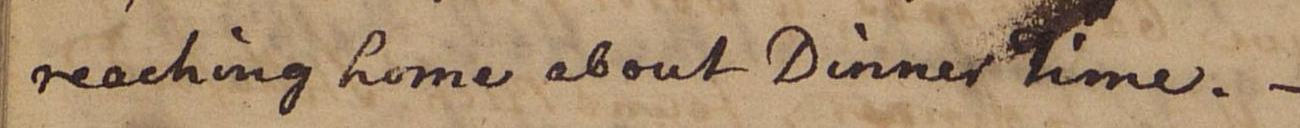reaching home about Dinner time. -
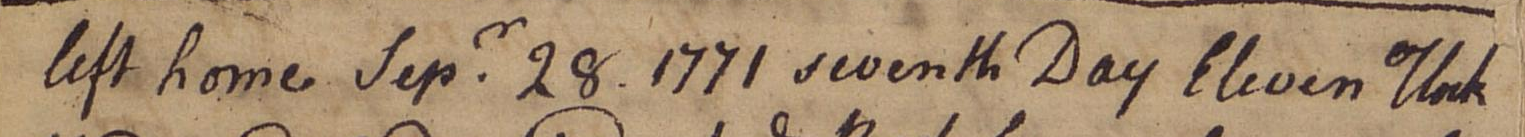left home Sep^m. 28. 1771 seventh Day Eleven oClock
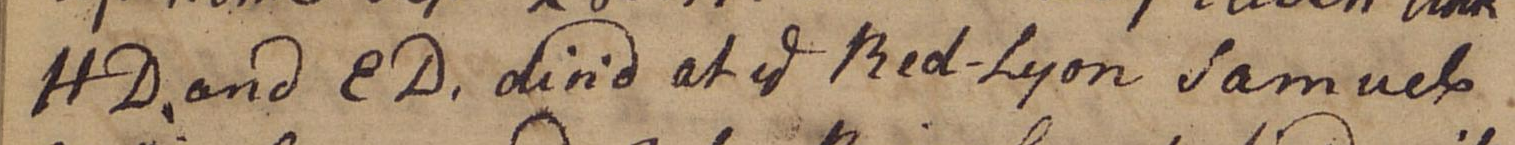HD, and ED. din'd at y^e Red-Lyon Samuel
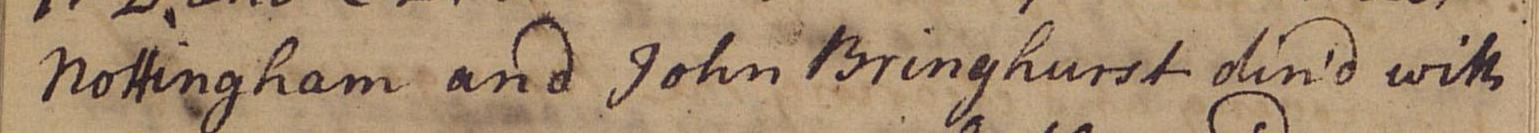Nottingham and John Bringhurst din'd with
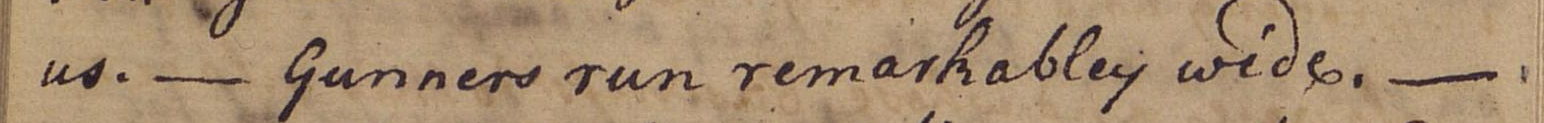us.- Gunners run remarkabley wide.-
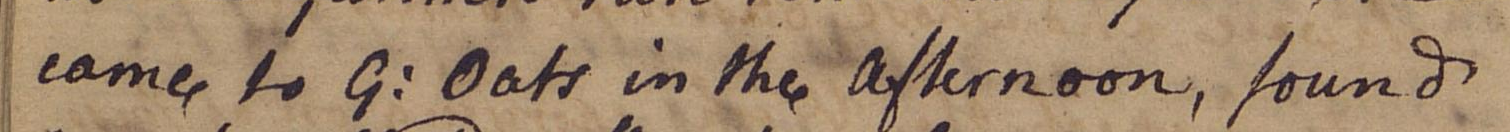came to G: Oats in the Afternoon, found
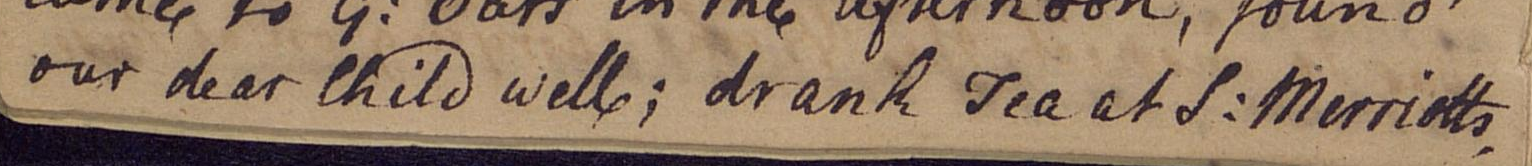our dear child well; drank Tea at S: Merriotts
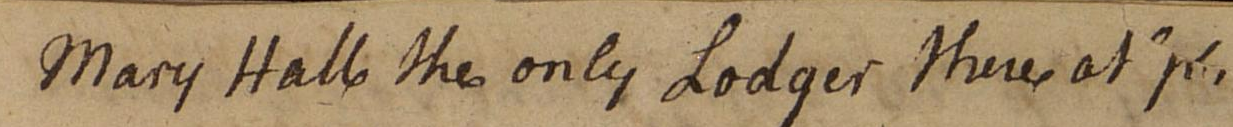Mary Hall the only Lodger there at p
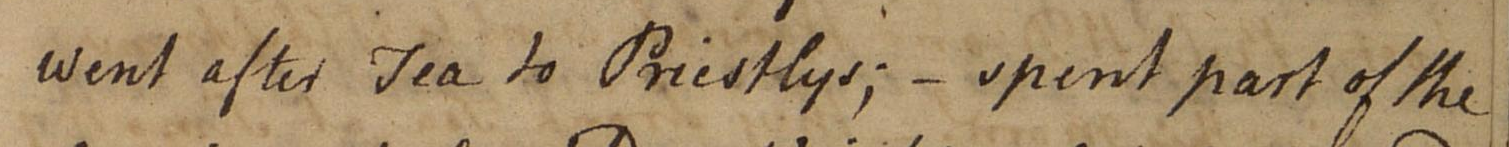went after Tea to Priestlys;- spent part of the
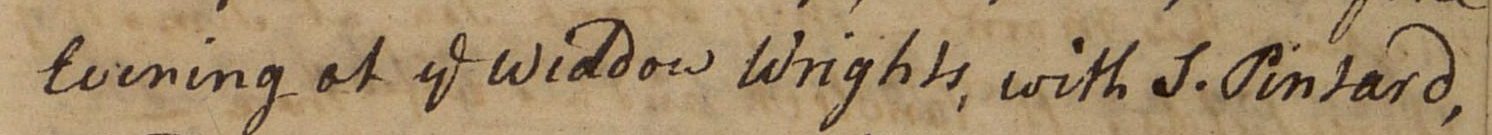Evening at y^e Widdow Wrights with S. Pintard,
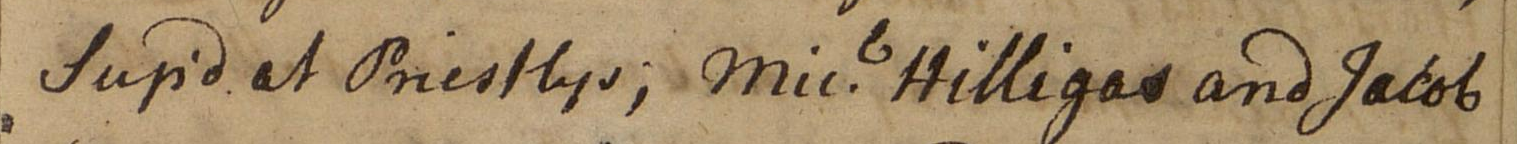Sup'd at Priestlys; Mic^l. Hilligas and Jacob
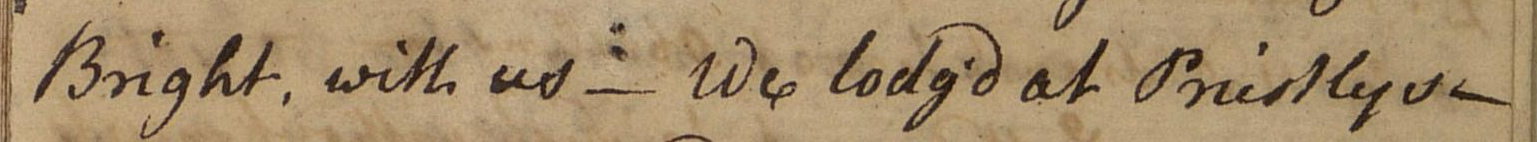Bright, with us- We lodg'd at Priestlys-
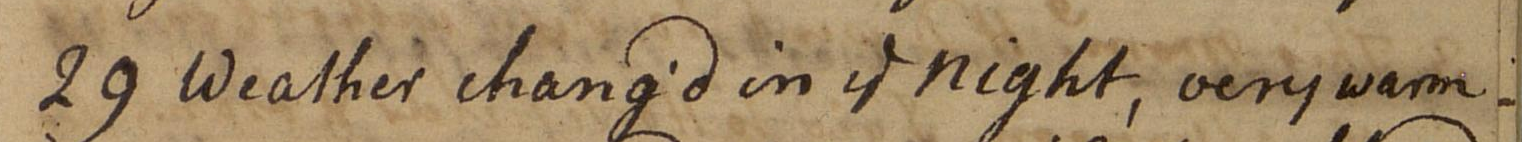29 Weather chang'd in y^e night, very warm
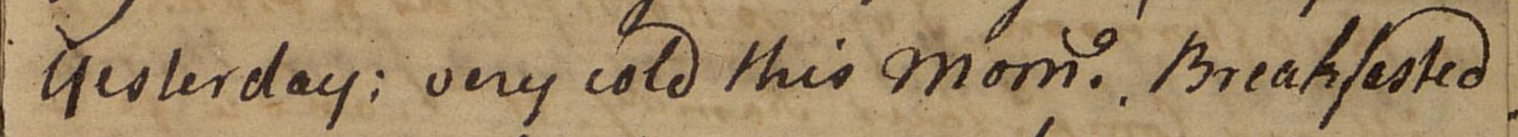Yesterday; very cold this morn^g. Breakfasted
